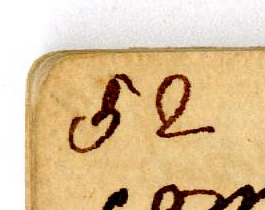52
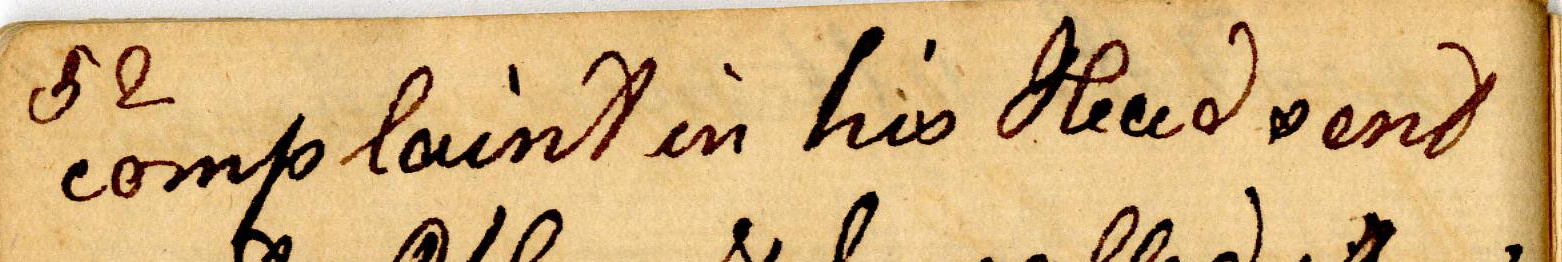complaint in his Head sent
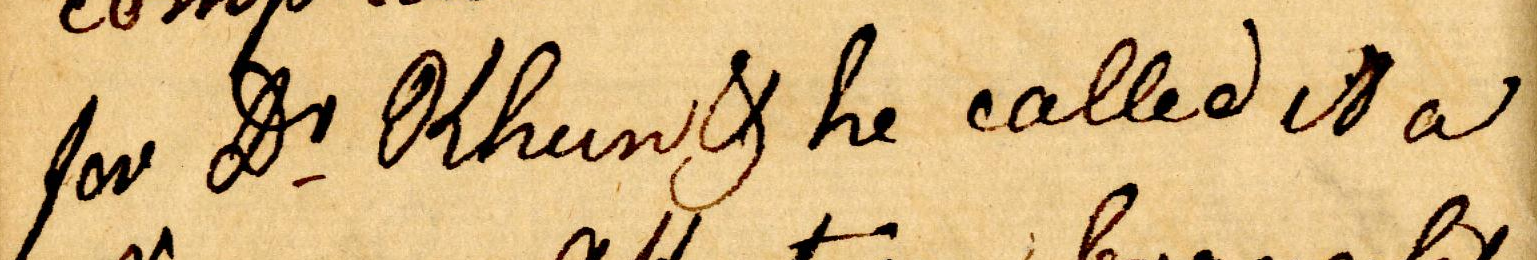for D^r Khun & he called it a
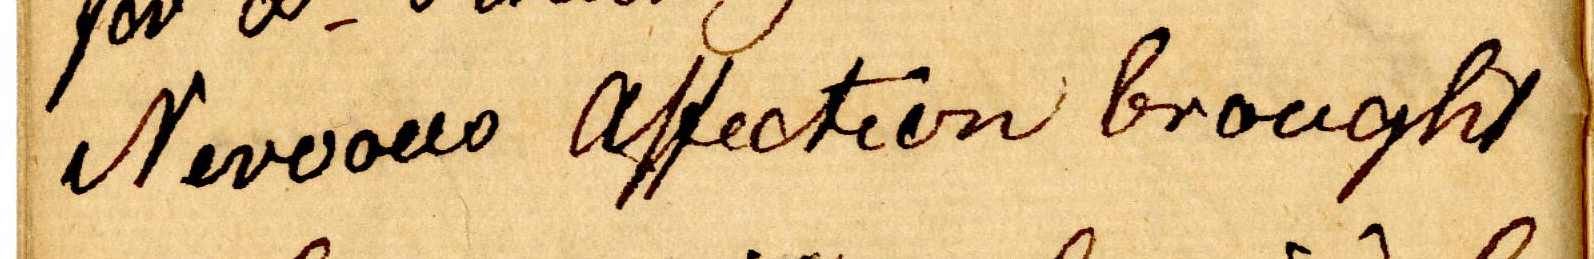Nervous Affection brought
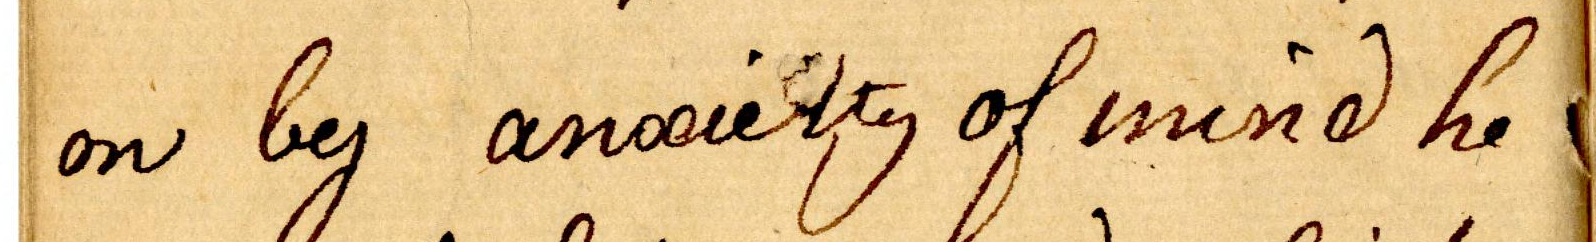on by anxietty of mind he
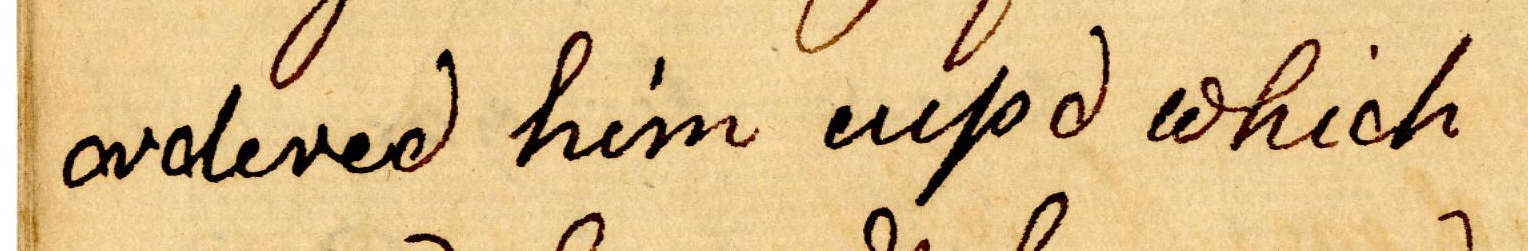ordered him cupd which
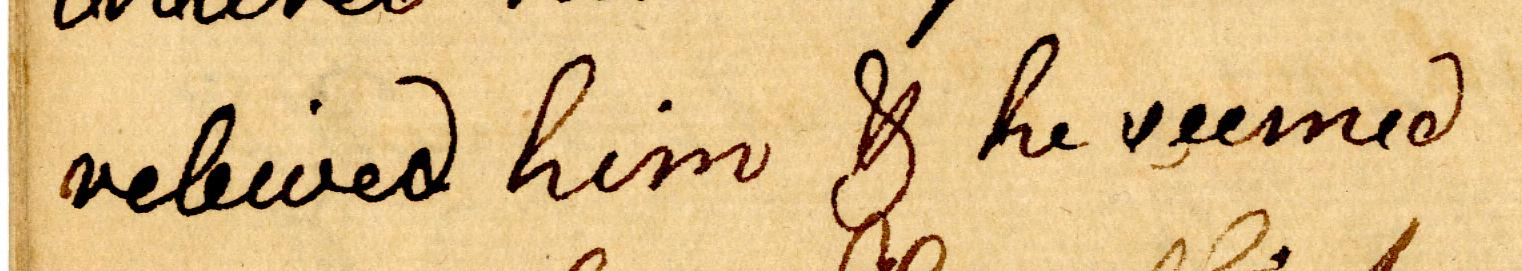releived him & he seemed
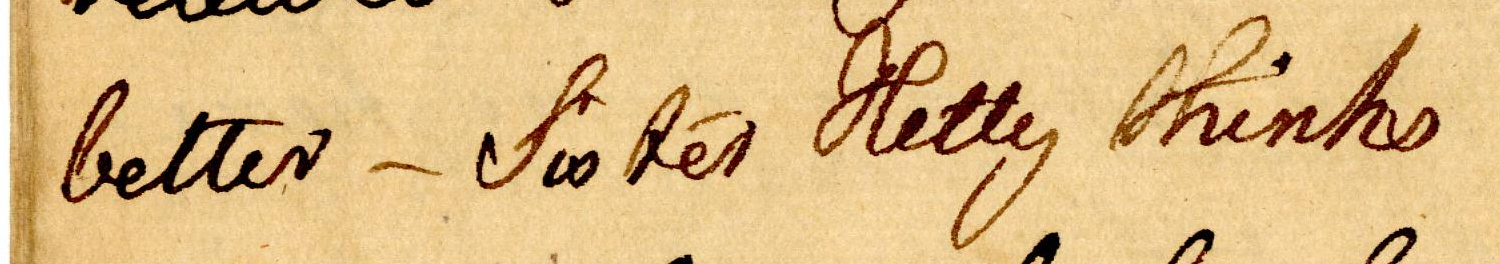better- Sister Hetty thinks
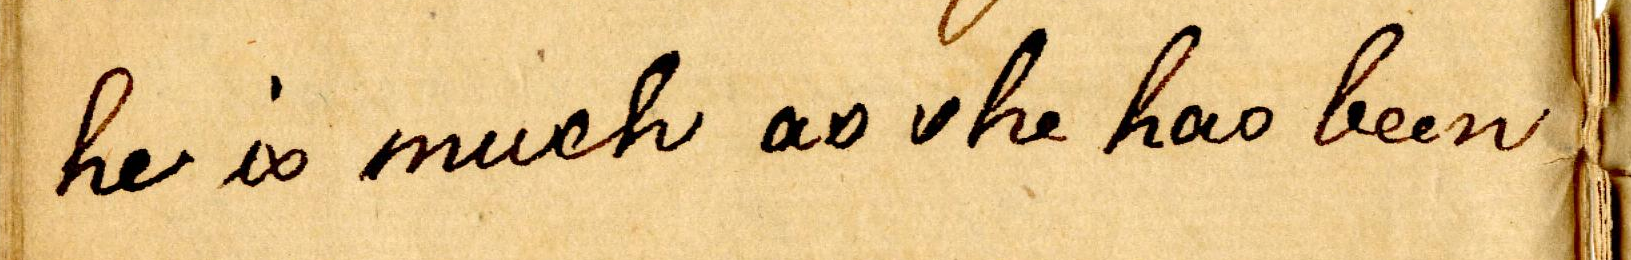he is much as she has been
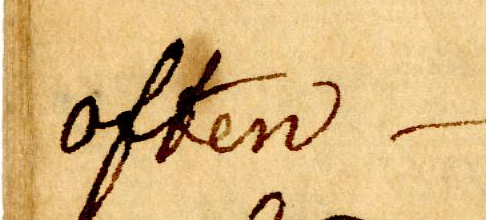often-
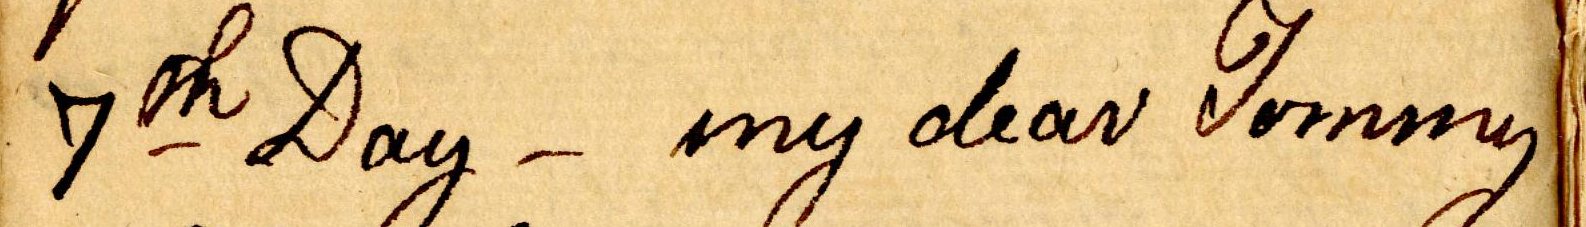7^th Day- my dear Tommy
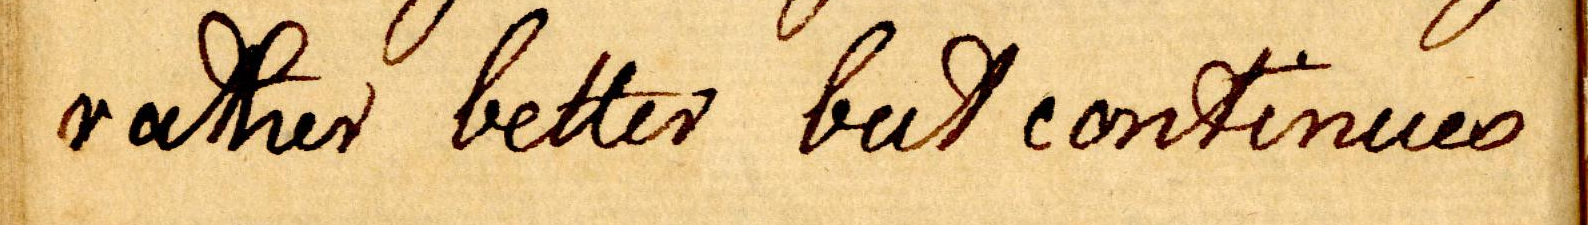rather better but continues
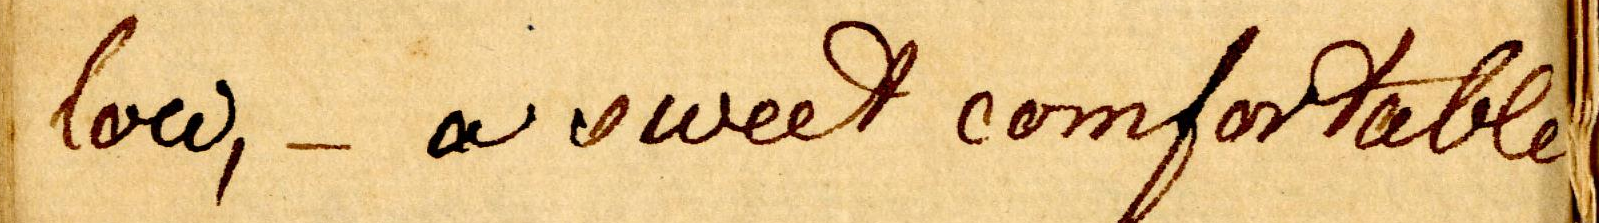low,- a sweet comfortable
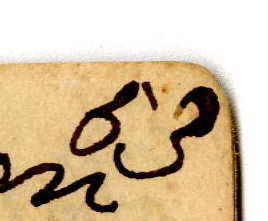53
